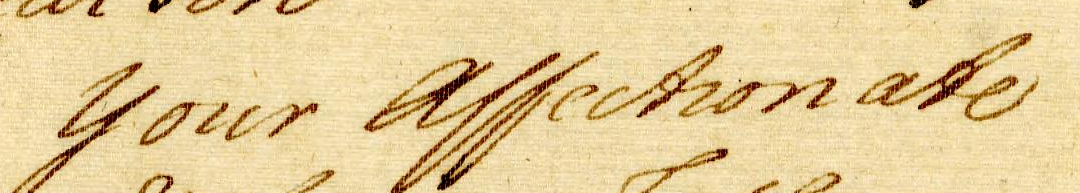Your Affectionate
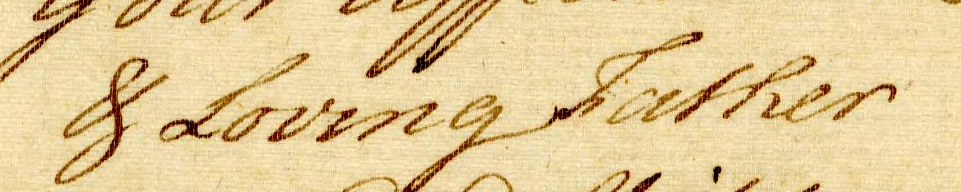& Loving Father
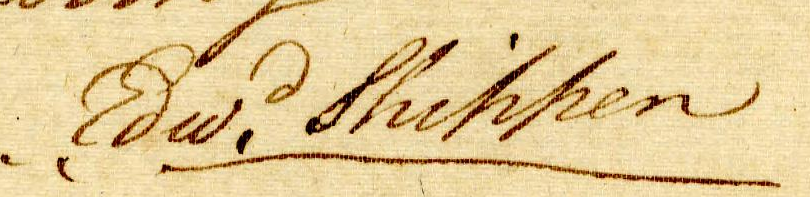Edw^d. Shippen
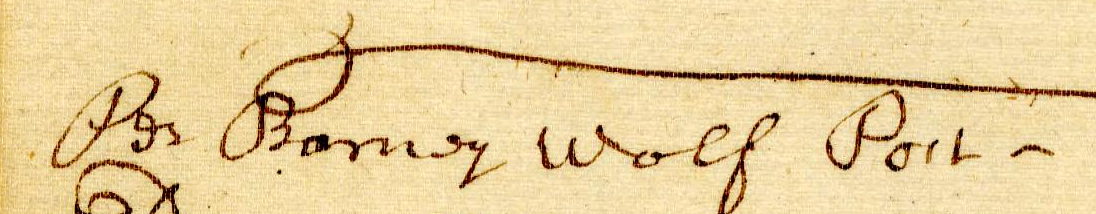Per Barney Wolf Post-
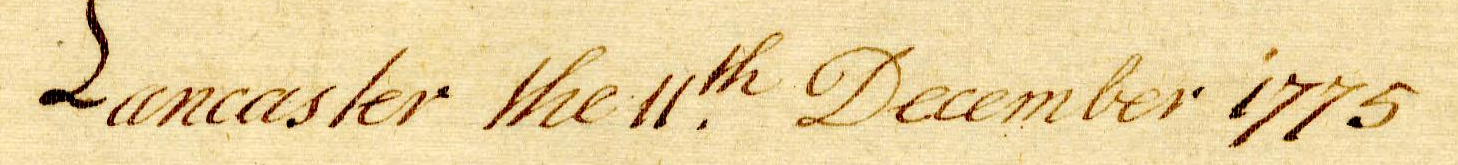Lancaster the 11^th. December 1775
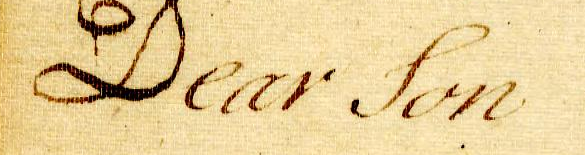Dear Son
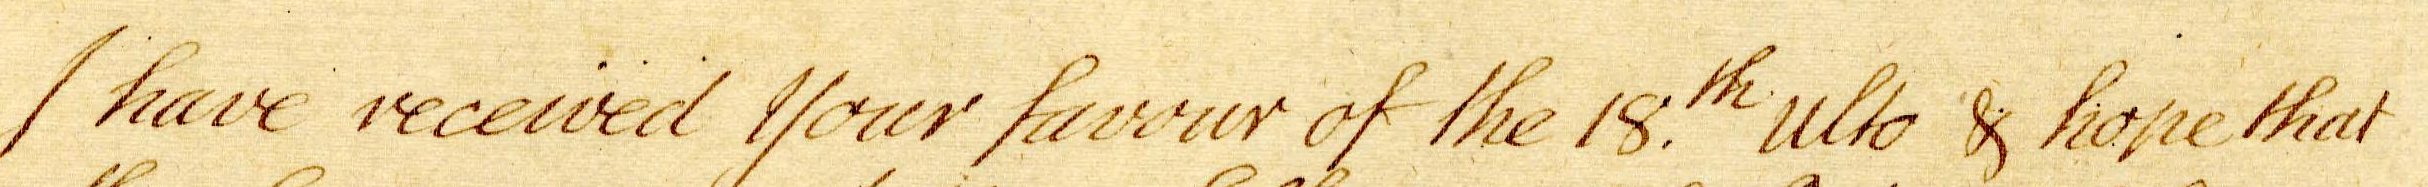I have received your favour of the 18.^th ulto & hope that
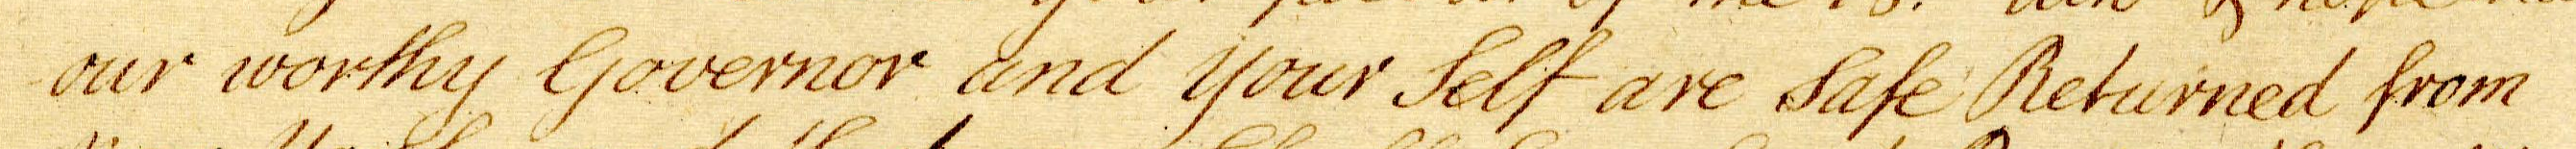our worthy Governor and your Self are Safe Returned from
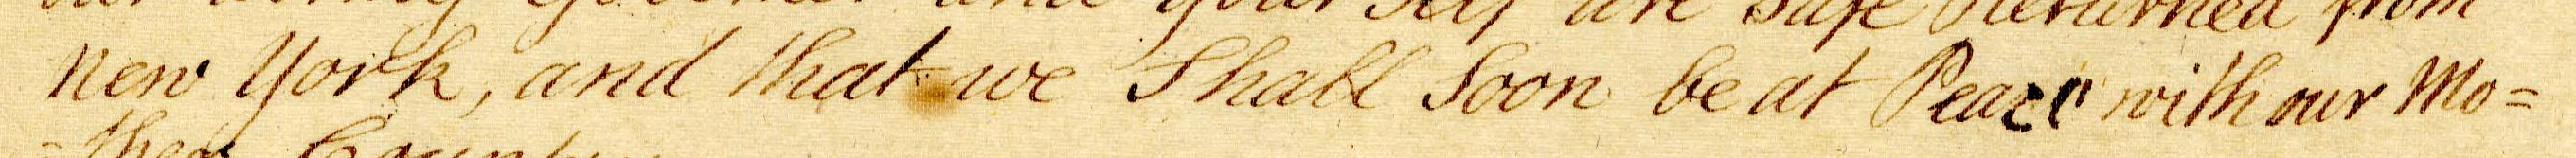New York, and that we Shall Soon be at Peace with our Mo-
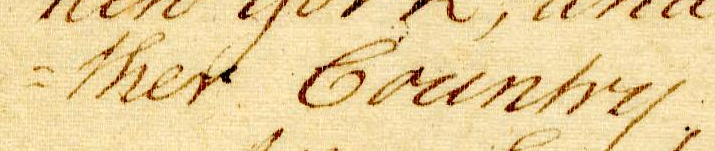-ther Country
